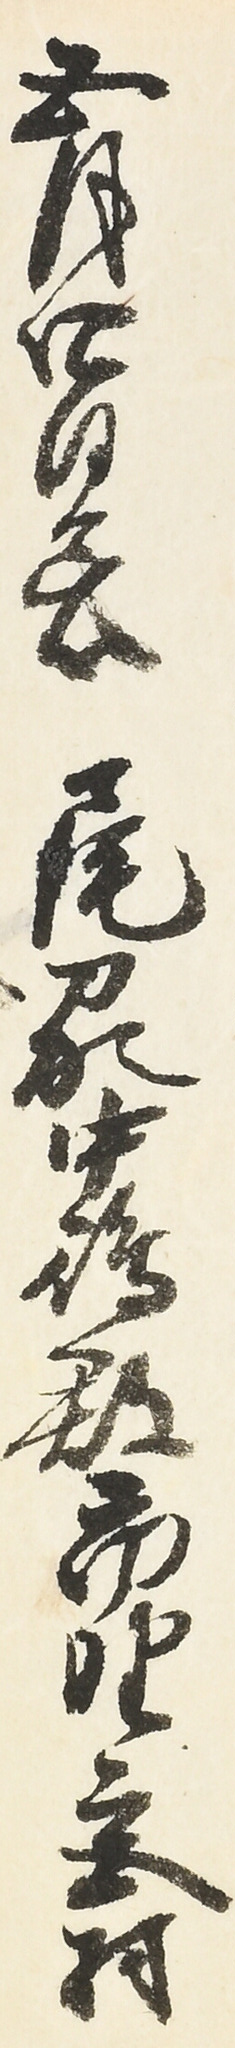五月四日着尾州中嶋郡市野宮村
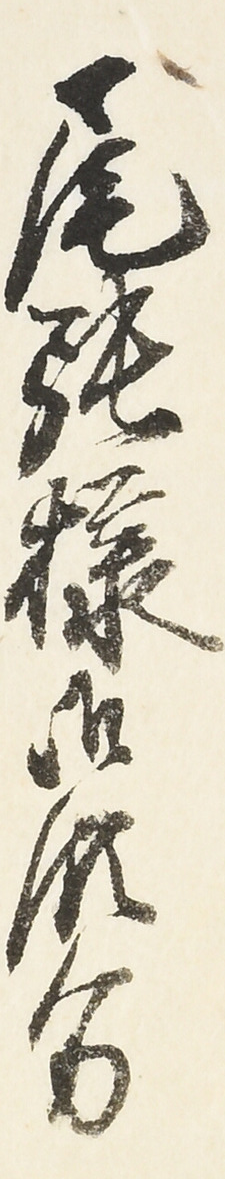尾張様御領分
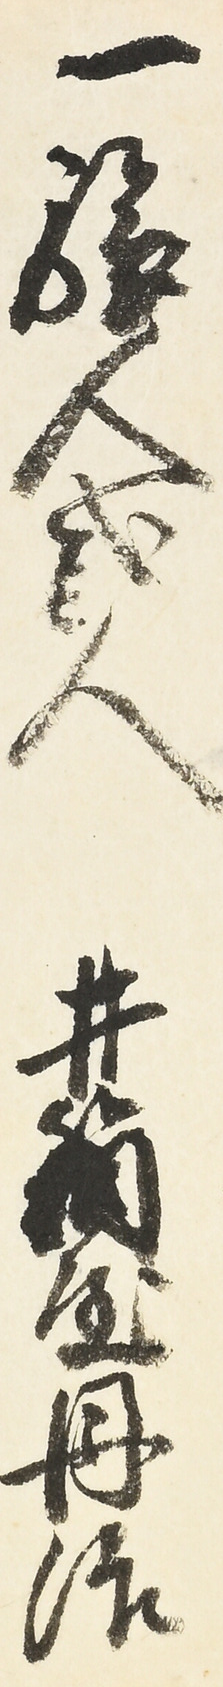一旅人弐人井筒屋丹治
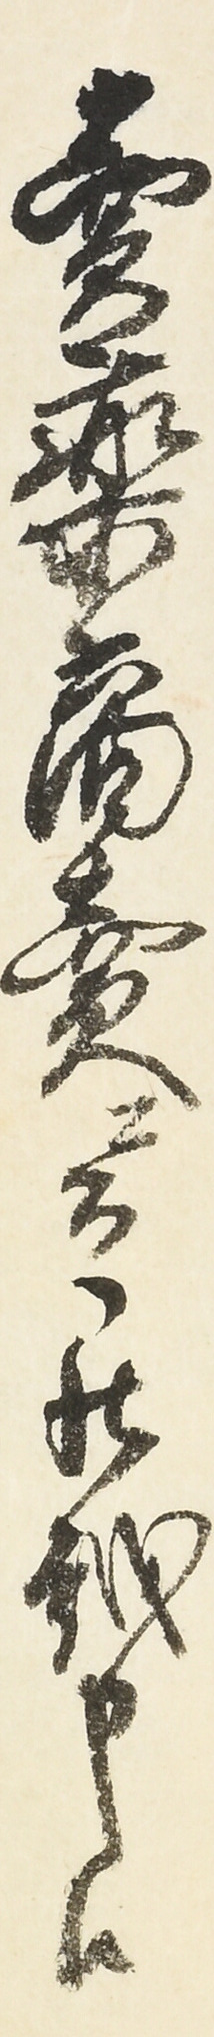売薬商売ニ而罷越申候
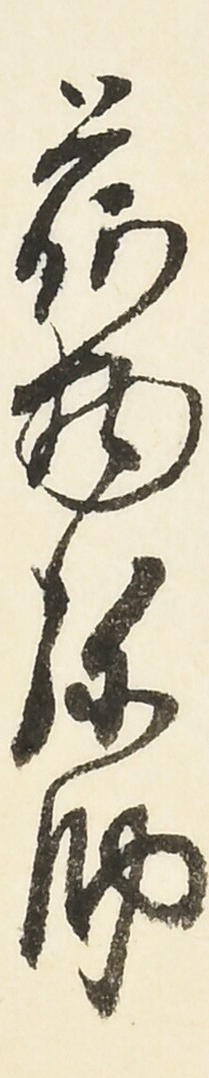荷物弥助
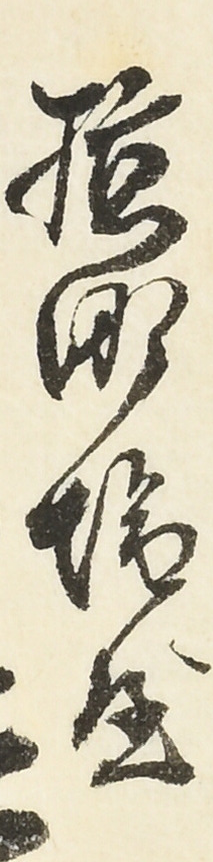横町塩屋
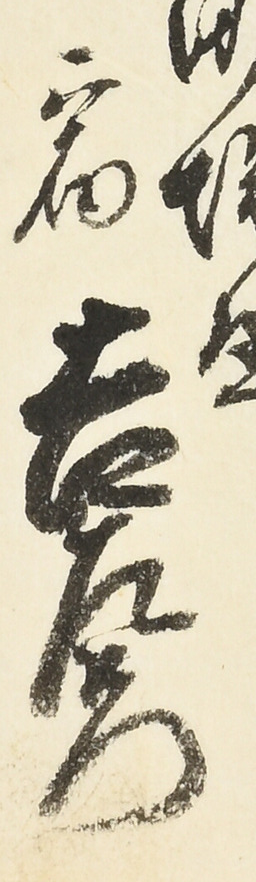宿吉左衛門
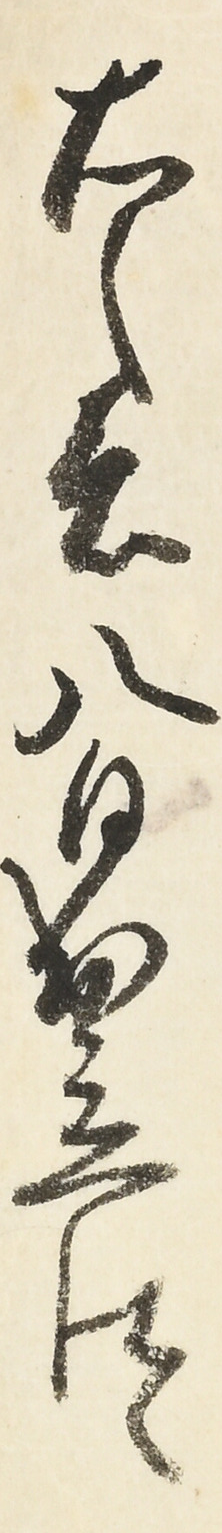右之者八月出立仕候

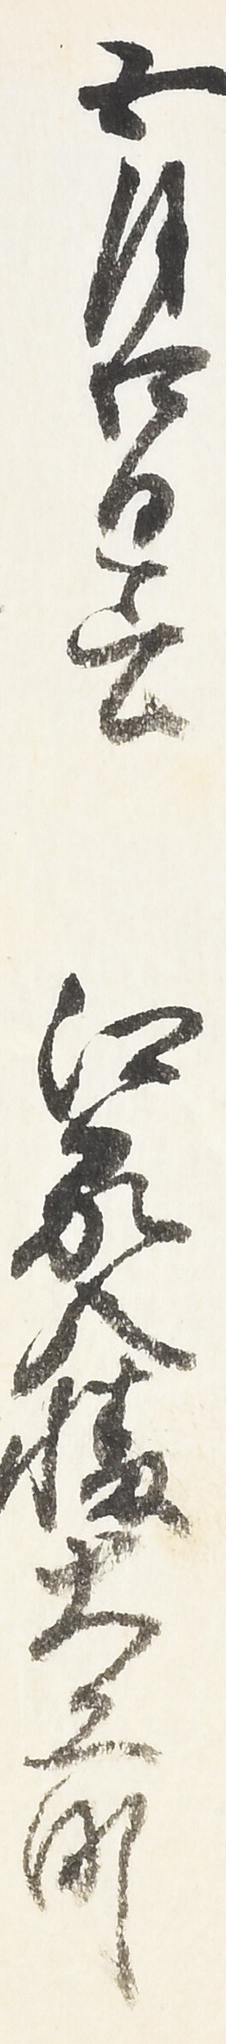五月四日着江州八幡大工町
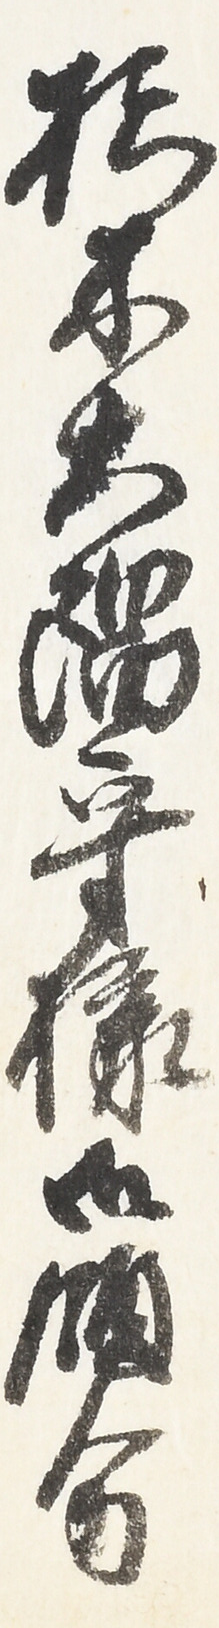朽木大隅守様御領分
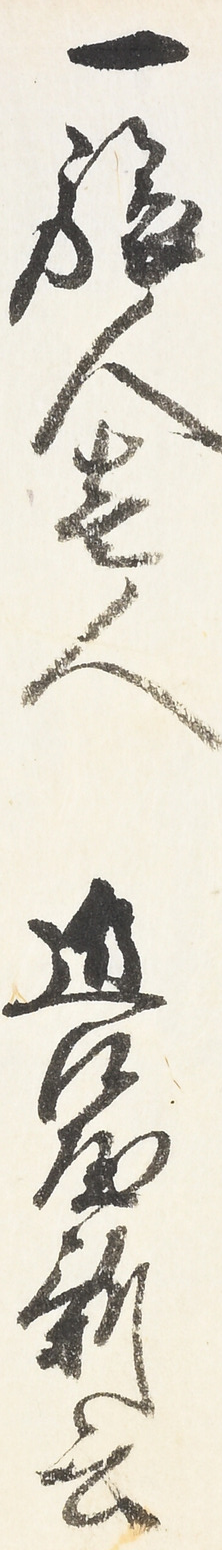一旅人壱人近江屋新六
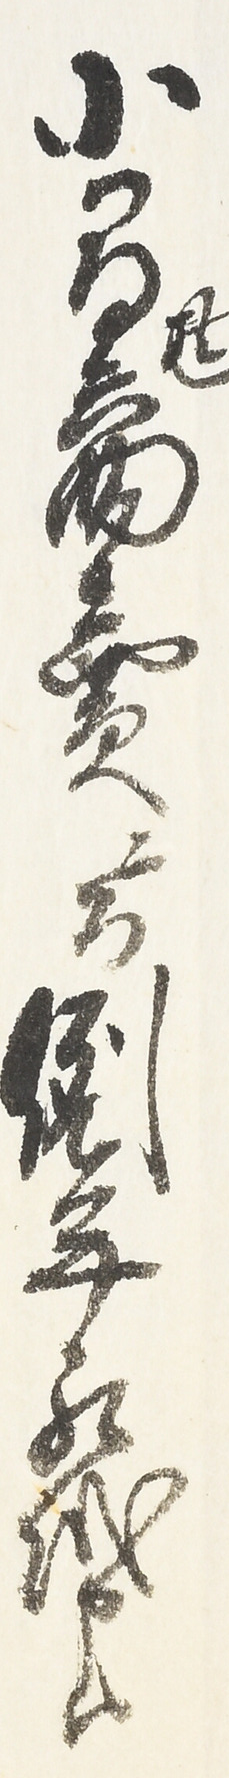小間商売ニ而例年罷越申候
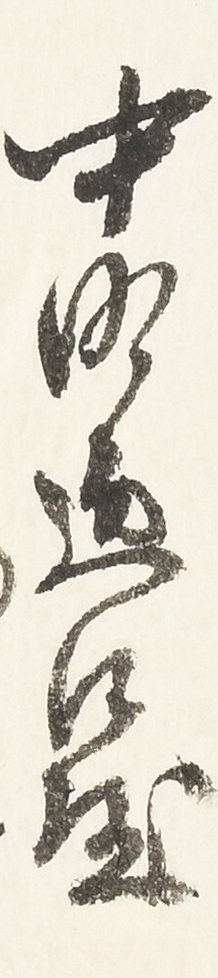中町近江屋
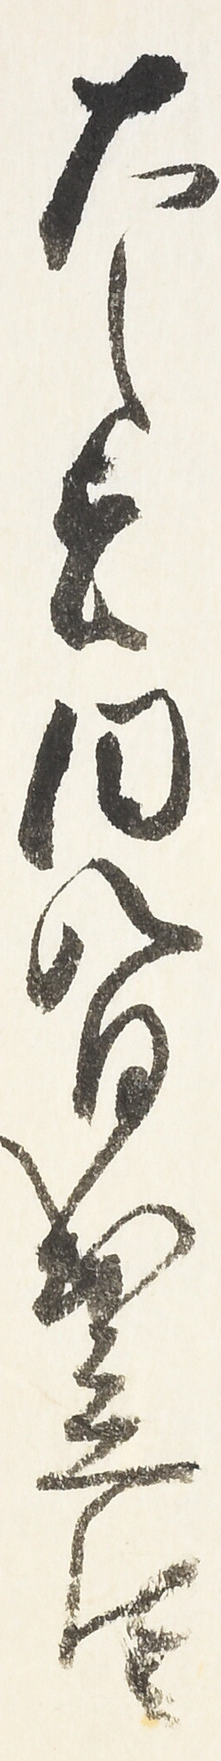右之者同八日出立仕候
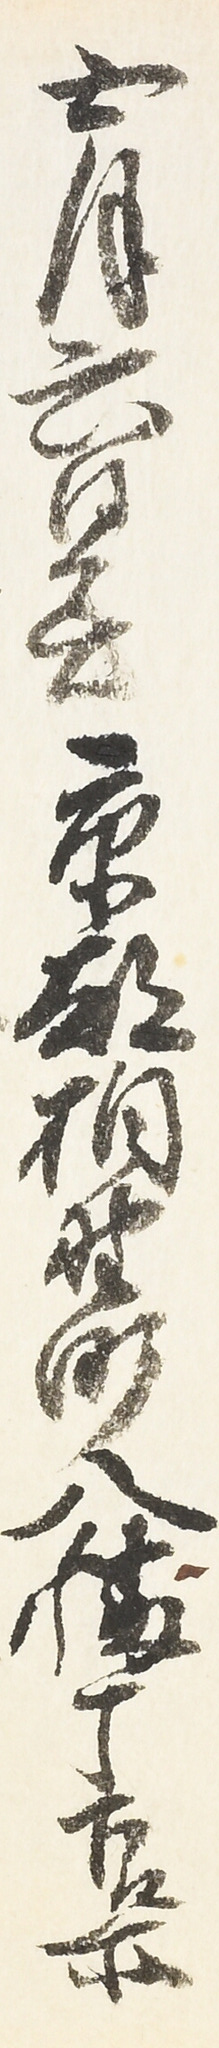五月六日着京都相野町八幡丁下ル所
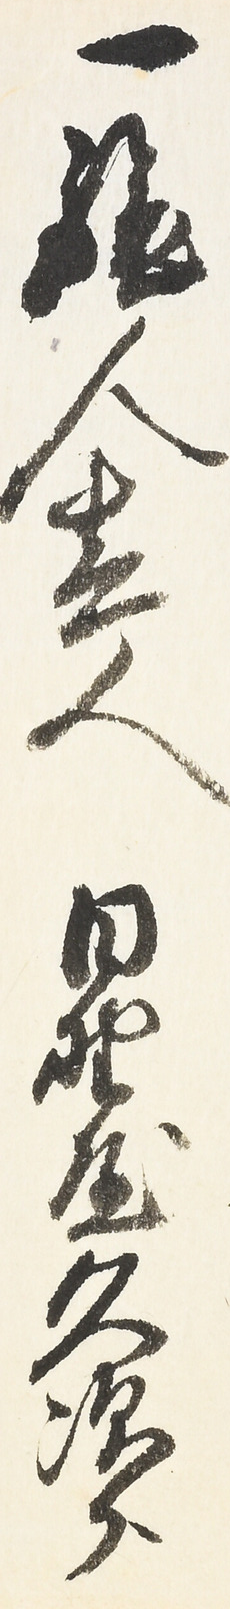一旅人壱人日野屋久次郎
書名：町中旅人泊控帳
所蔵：伊那市立高遠町図書館・合同会社AMANE
